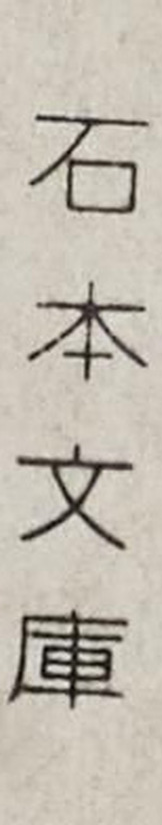石本文庫
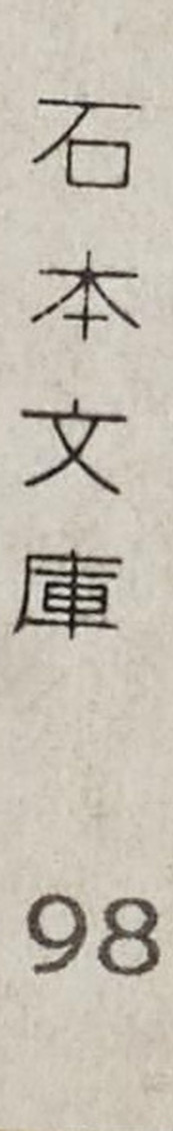石本文庫

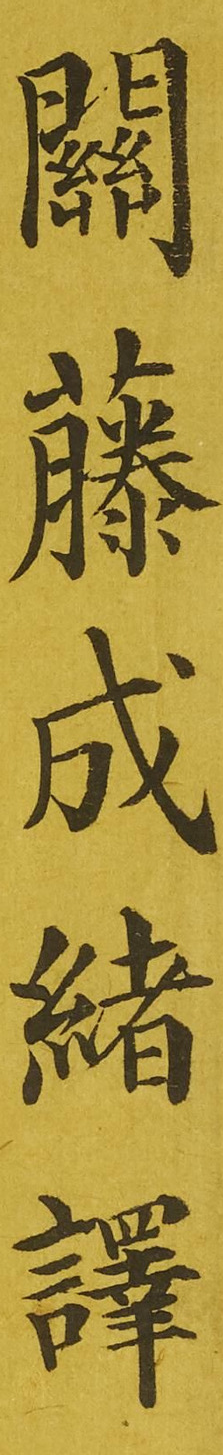関藤成緒訳
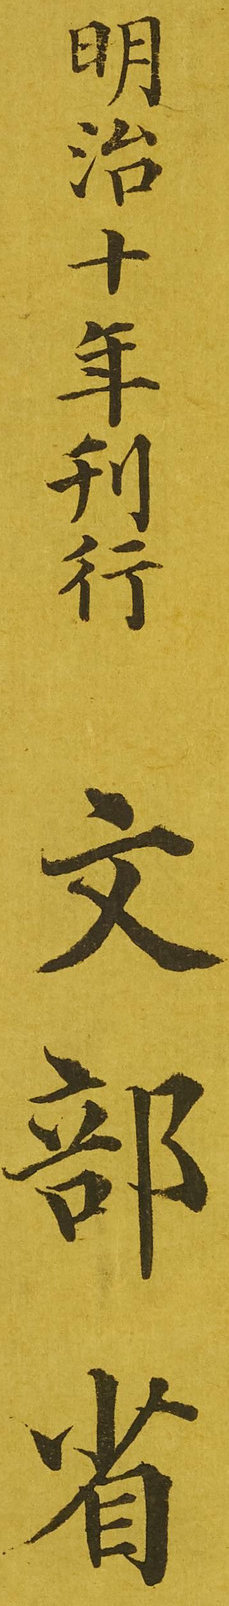明治十年刊行文部省
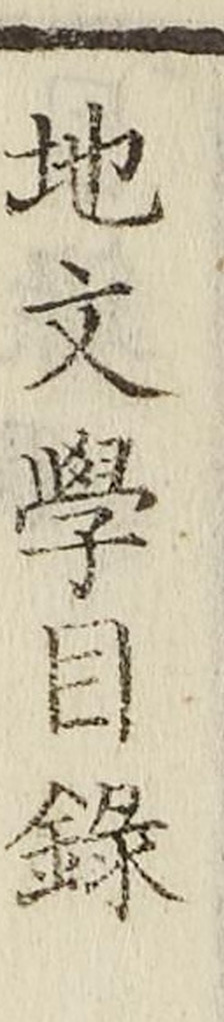地文学目録
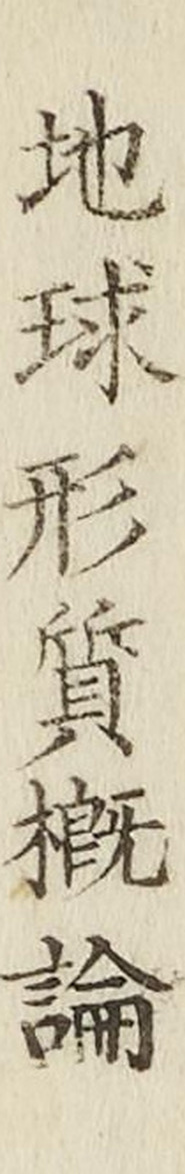地球形質概論
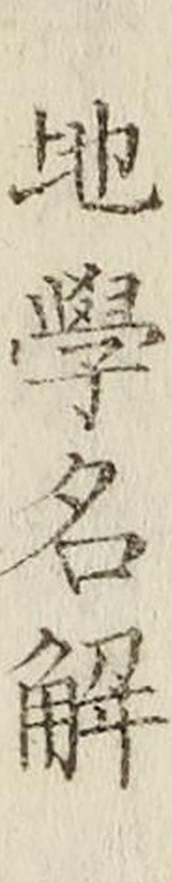地学名解
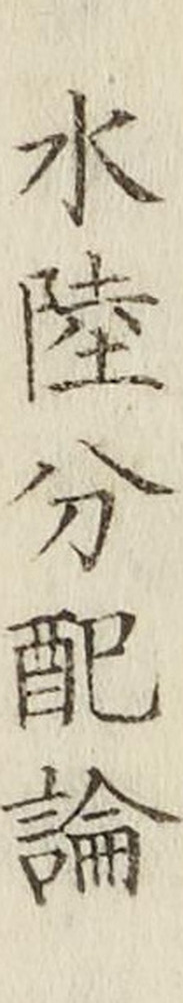水陸分配論
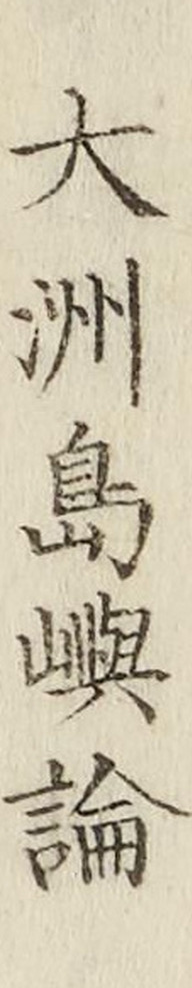大洲島嶼論
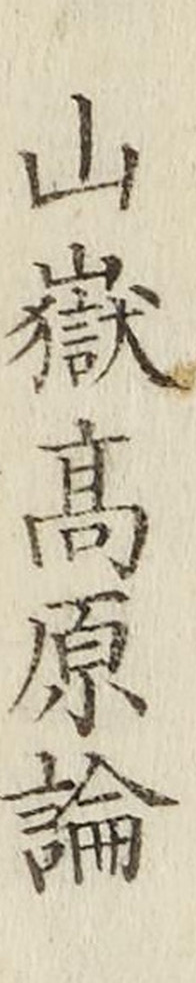山嶽高原論
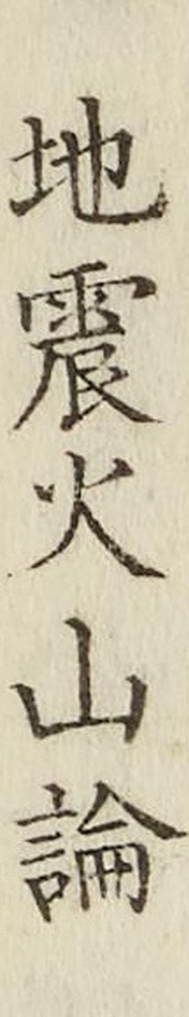地震火山論
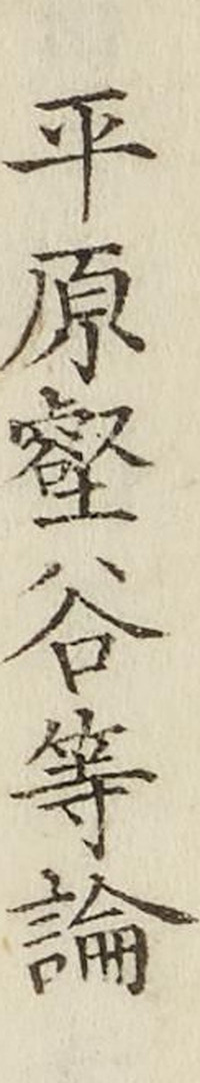平原壑谷等論
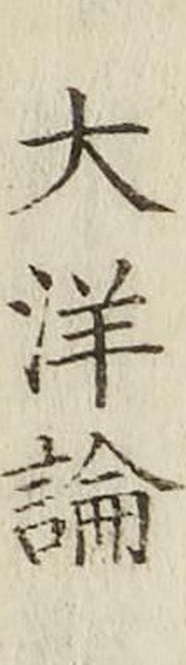大洋論
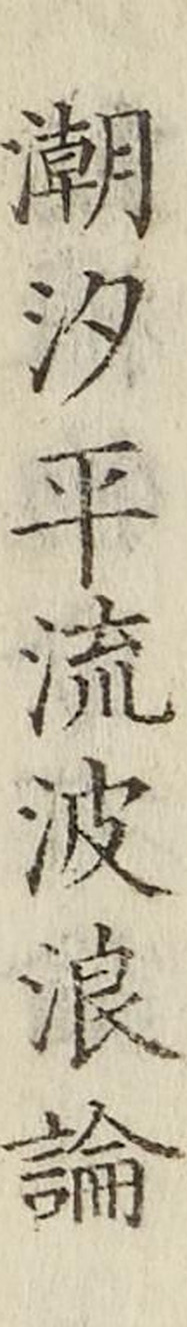潮汐平流波浪論
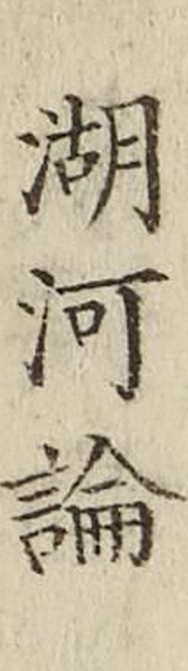湖河論

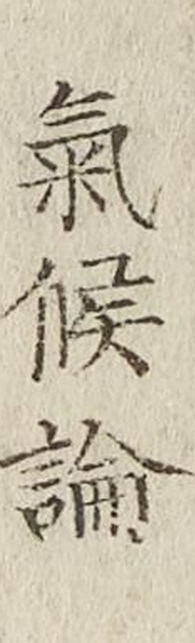気候論
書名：百科全書　地文學　全
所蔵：東京大学地震研究所図書室 Earthquake Research Institute Library, The University of Tokyo, JAPAN
